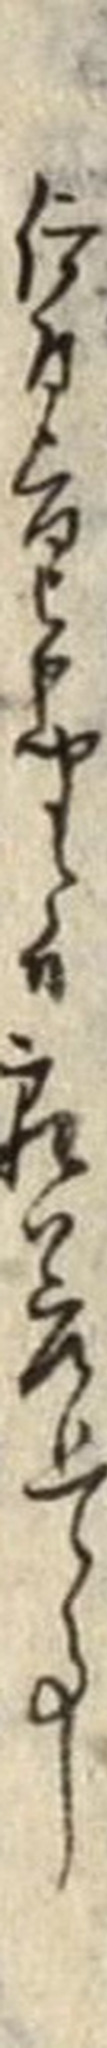仰付旨被申聞候ニ付願差上候事
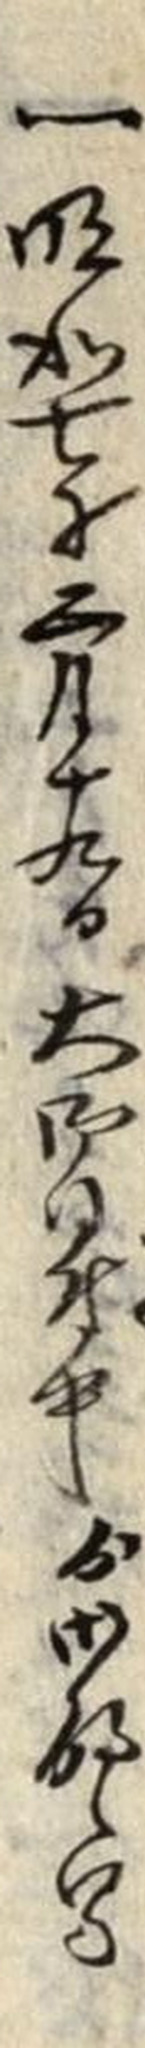一明和七寅正月十九日大御目付中ゟ御触之写
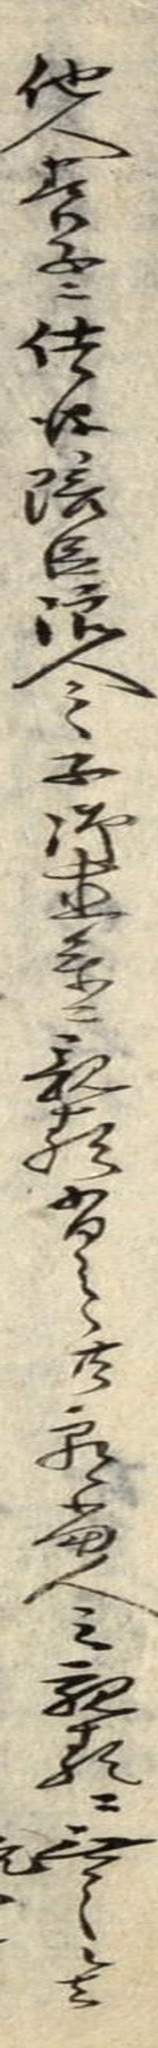他人養子ニ仕候儀陪臣浪人之子御直参ニ親類有之候共願候当人之親類ニ無之候者
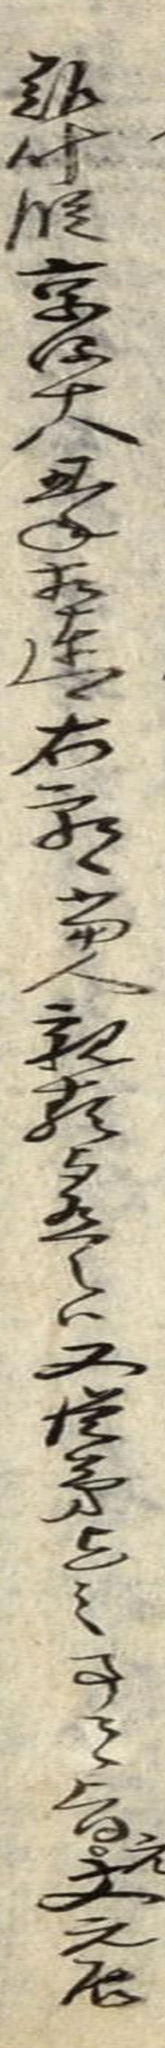難叶段享保十八丑年相達候右願候当人親類与有之ハ又従弟迄之事ニ候旨◦元文元辰
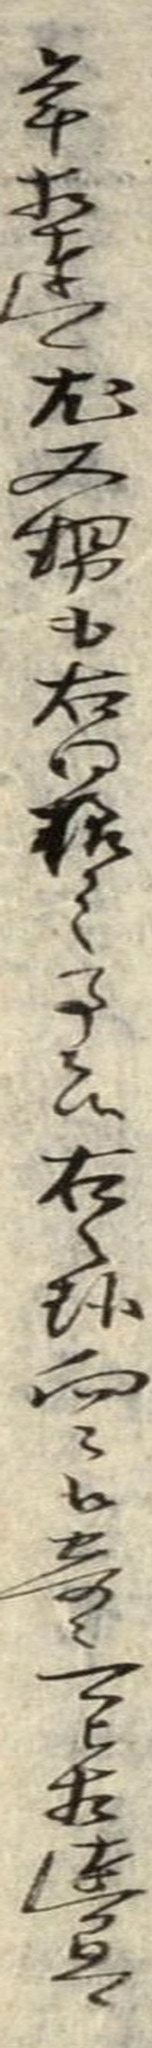年相達候尤又甥も右同様之事ニ候右之趣向々江寄々可被相達置候
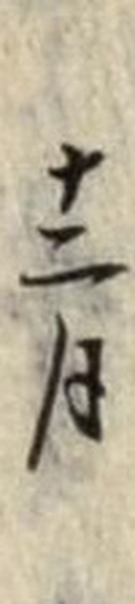十二月

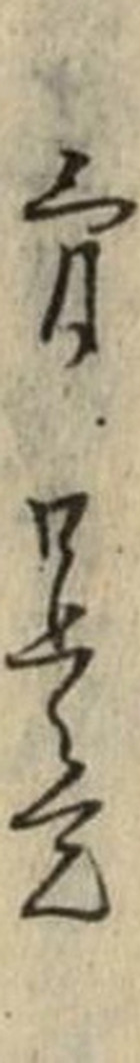一三月口上之覚
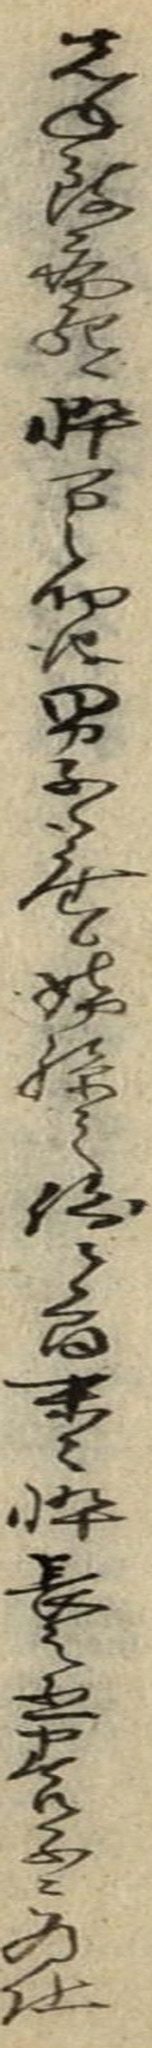先年致病死候悴万之助儀男子御座候嫡孫之儀に候間末々悴長之丞養子に為仕
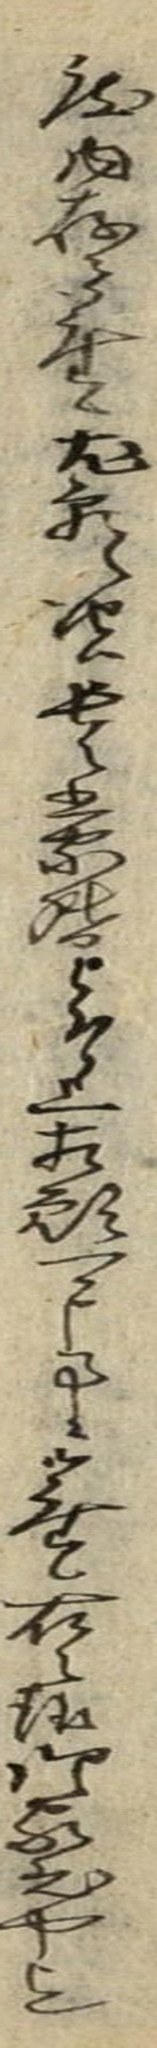度内存に御座候尤願之儀は長之丞家督被下候上相願可申事に御座候右之趣御家老中迄
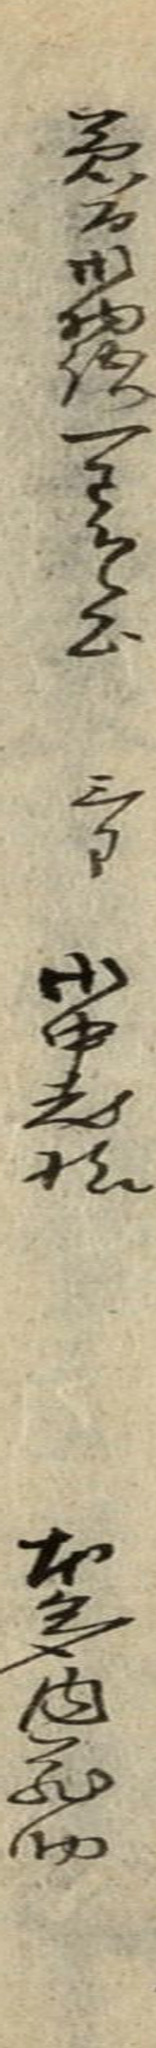兼而御物語可被下候以上三月御中老様本多内蔵助
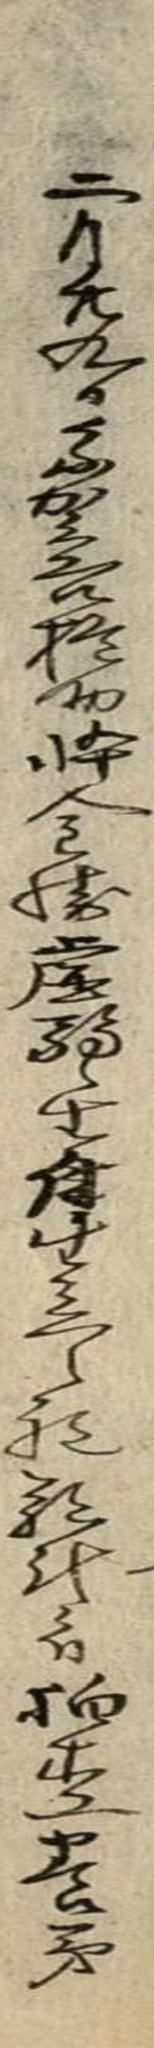一二月廿九日多賀谷権助悴金勝虚弱之生付生立之程難計に付柏杢養弟
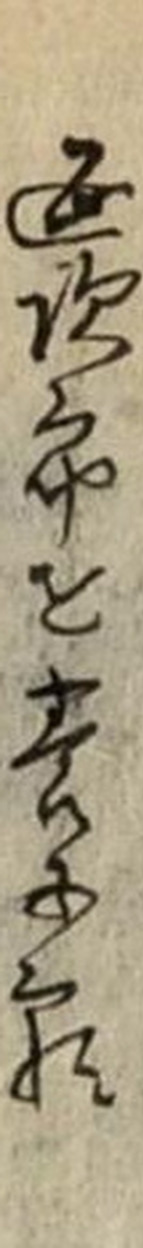延次郎を養子願
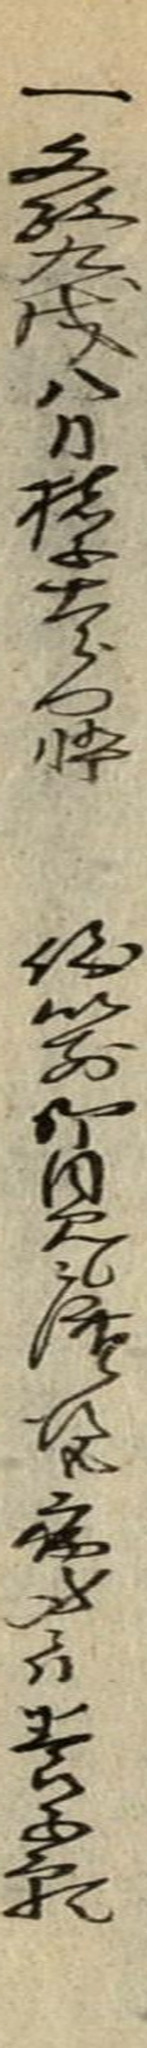一文政九戌八月猪子太郎右衛門悴儀以前御目見も済候得共病身に付養子願
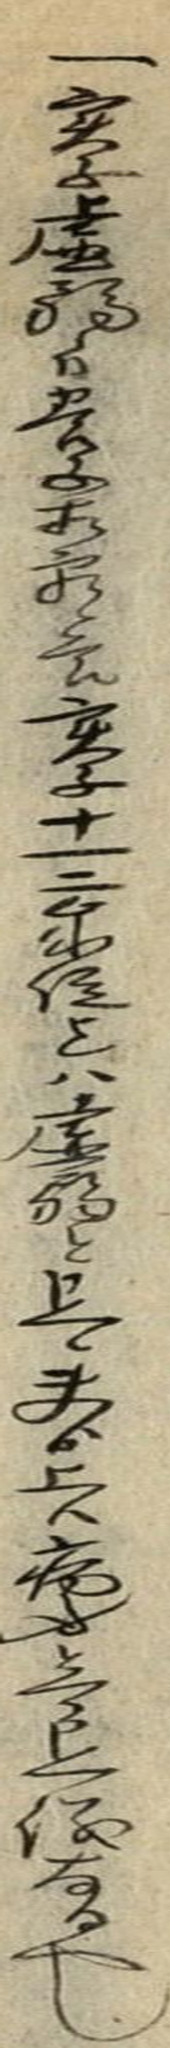一実子虚弱に付養子相願候節実子十一二歳位迄は虚弱と申上候夫ゟ上は病身と可申上儀なるへし
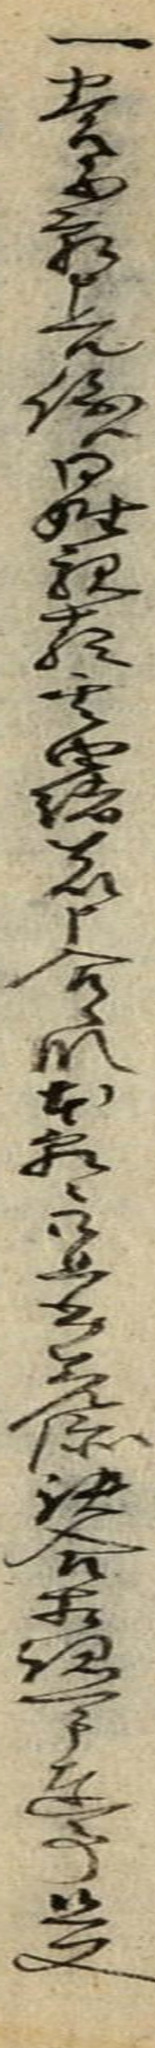一養子願申上る儀は同姓親類其由緒を以申合候段本願之口上書差添訳合相認可申達事且又
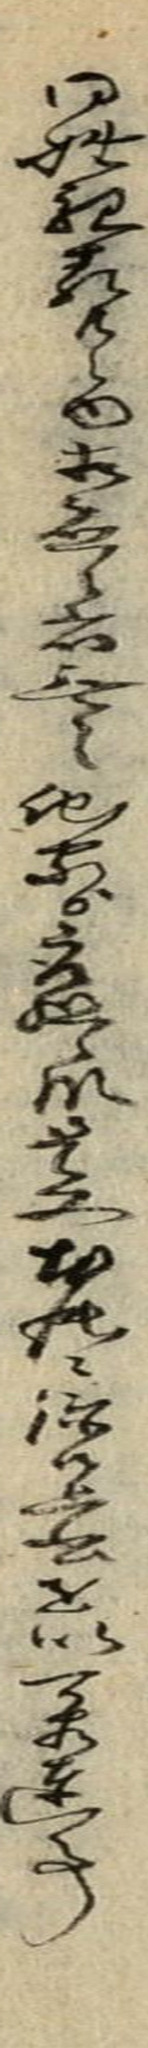同姓親類共之内相応之者無之他家ゟ取組候段是又本紙に添口上書を以可相達事
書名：養子縁組之部
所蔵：福井県文書館 Fukui Prefectural Archives
